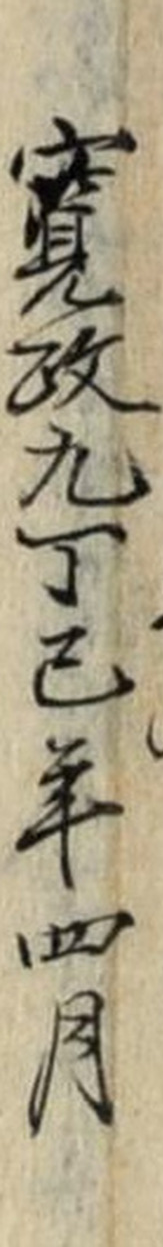寛政九丁巳年四月
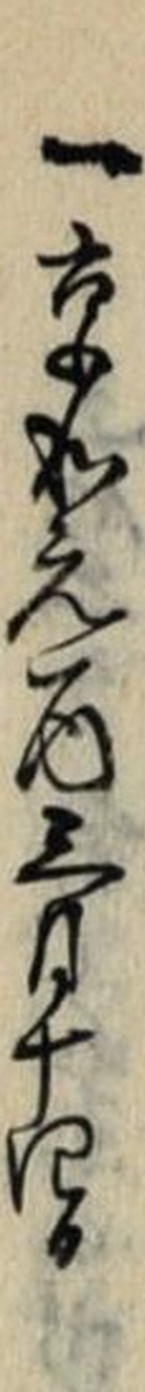一享和元酉三月十四日
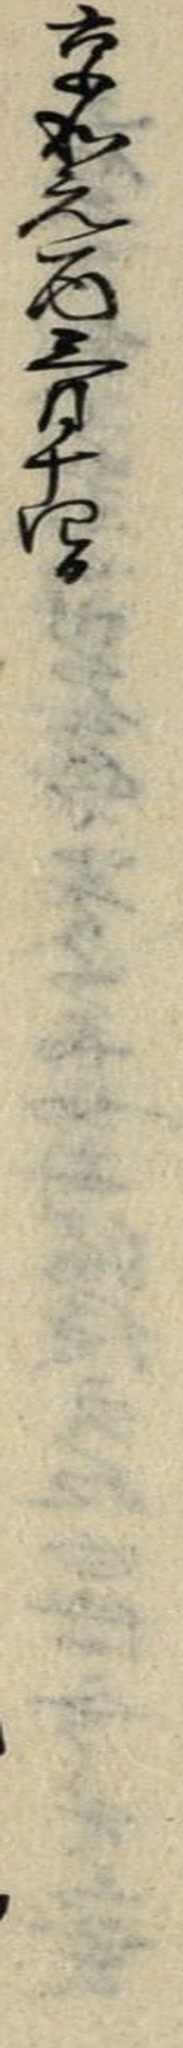一享和元酉三月十四日
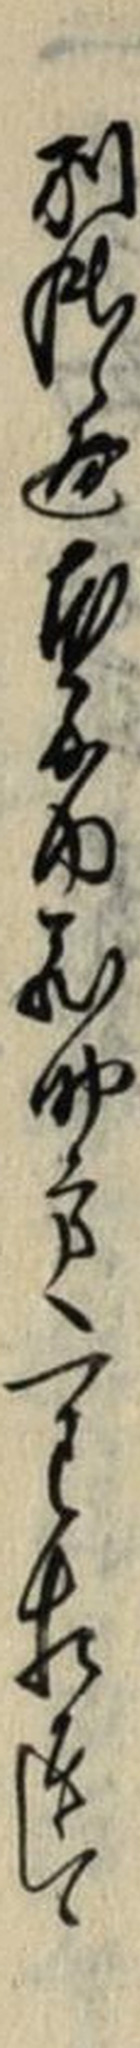別帳之通本多内蔵助方ヘ可被相達候
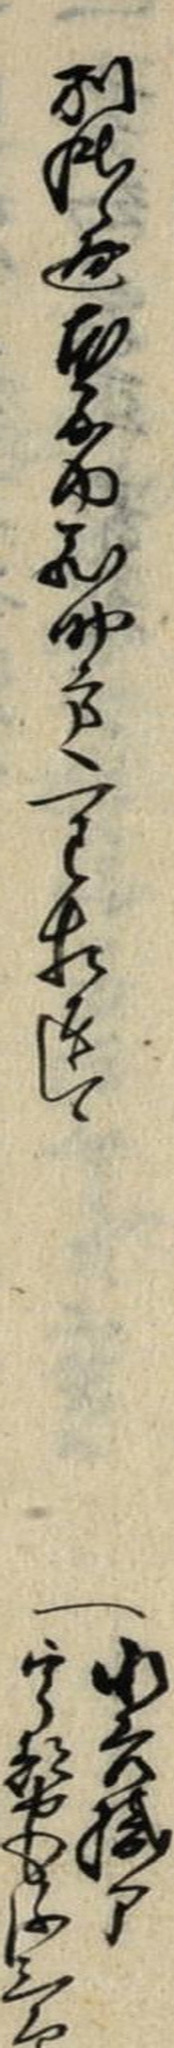別帳之通本多内蔵助方ヘ可被相達候
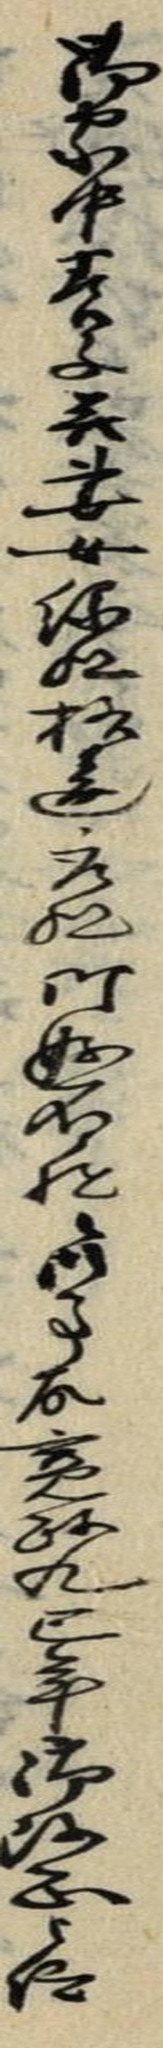御家中養子并妻女縁組格違取組御好不被遊候御事故寛政九巳年御改正被仰
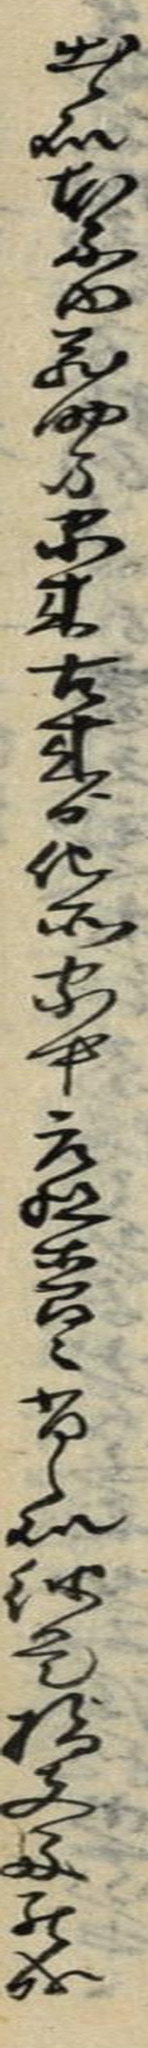出候処本多内蔵助方家来古来ゟ他所家中取組等間々有之候処彼是指支多罷成
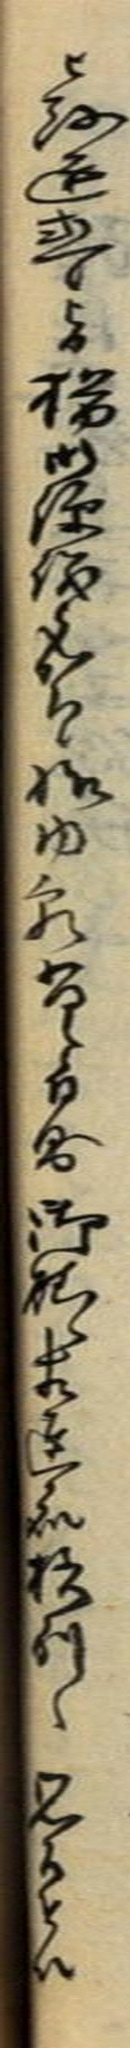被致迷惑候旨猶御評議被成下候様内願有之ニ付則御候相達候処格別之思召と候
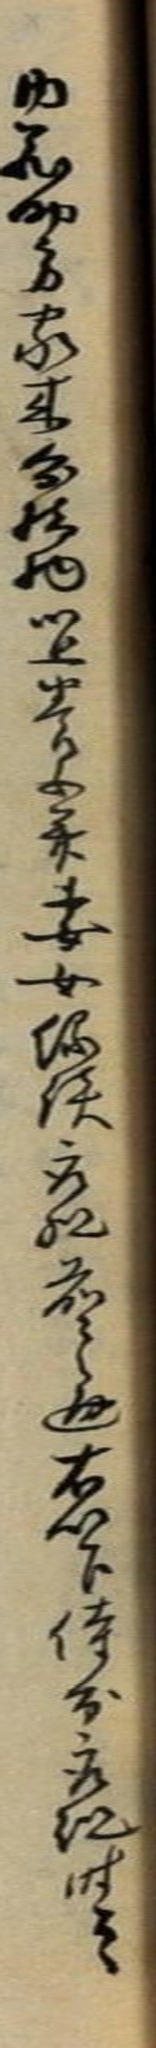内蔵助方家来分指物以上養子并妻女縁談取組前々之通右以下侍分取組時之
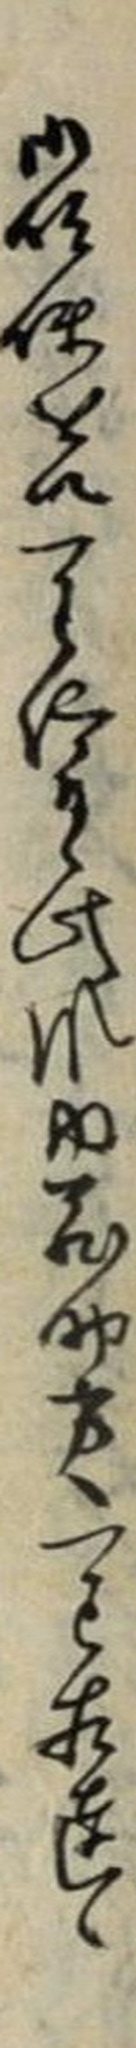御吟味を以可被仰付候此段内蔵助方ヘ可被相達候
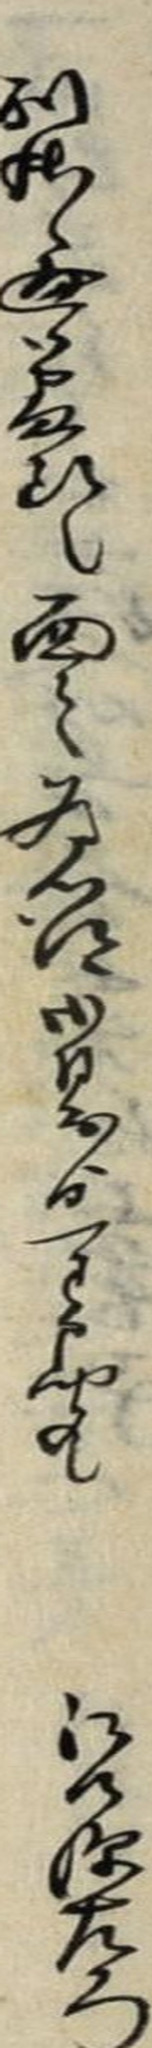別帳之通御番頭之面々為心得御自分ゟ可被申聞候江口源左衛門
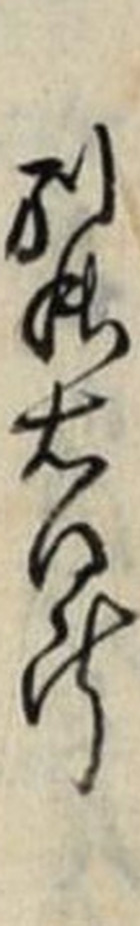別帳右同断
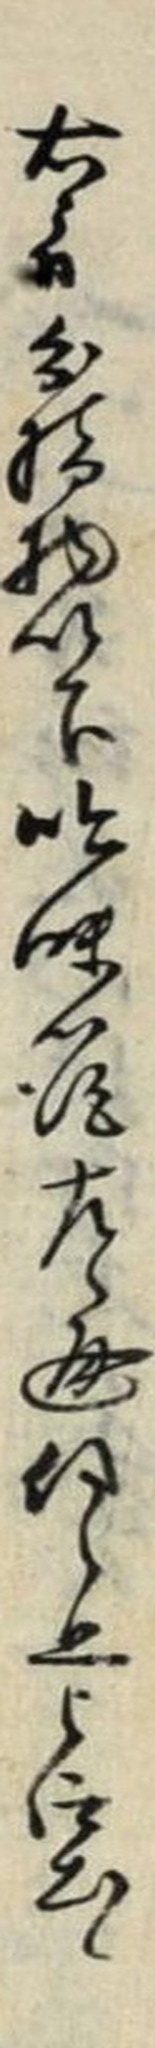右ニ付分指物以下吟味心得左之通伺之上被仰出候
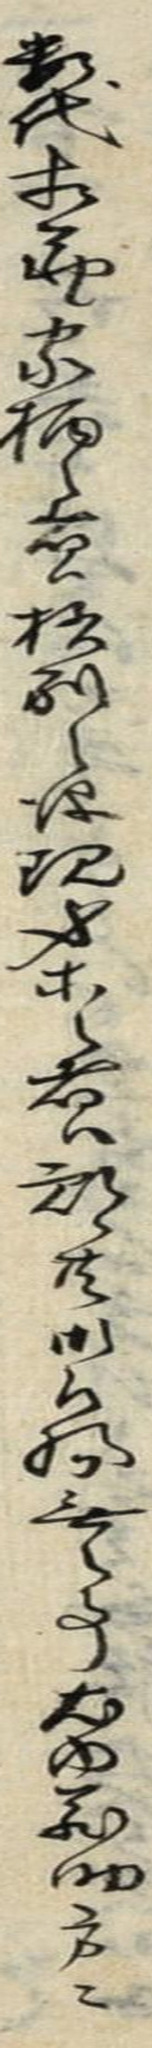数代相勤候家柄之者ハ格別之儀現身等之者ハ願候共御取揚無之事尤内蔵助方ニ
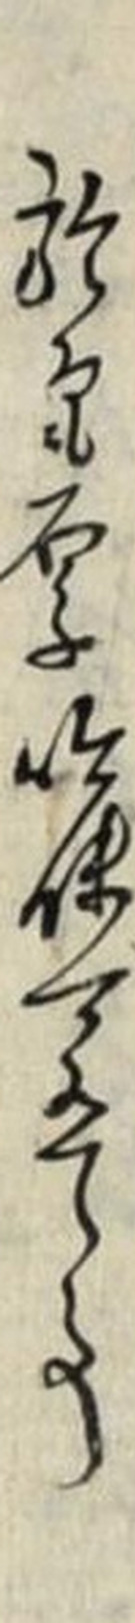於而も厚吟味可有之事
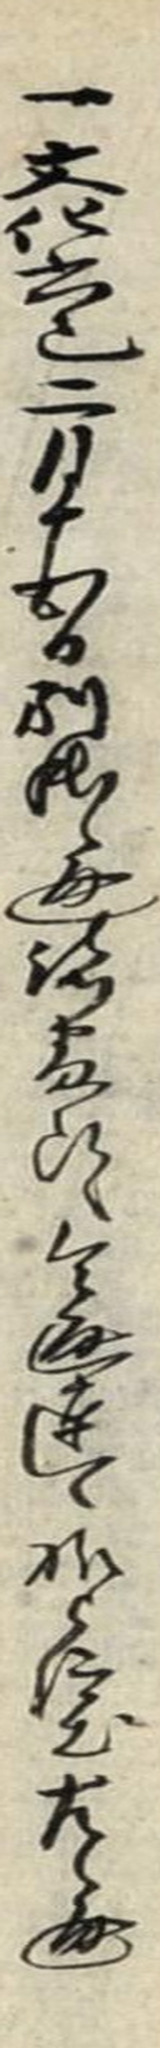一文化六巳二月十五日別帳之通諸番頭ヘ令通達候様被仰出左之通
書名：養子縁組之部
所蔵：福井県文書館 Fukui Prefectural Archives
